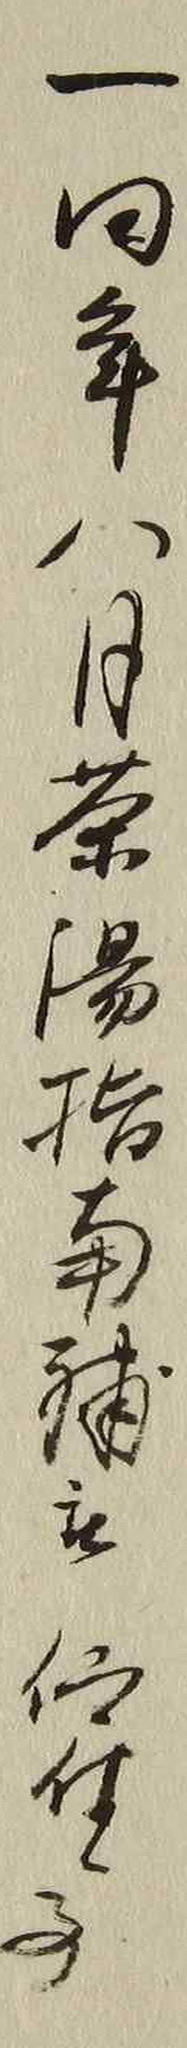一同年八月茶湯指南補被仰付候事
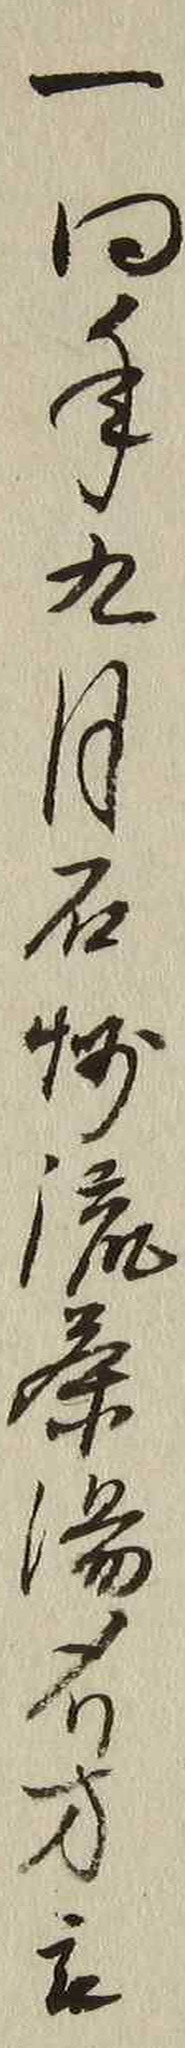一同年九月石州流茶湯〆り方被
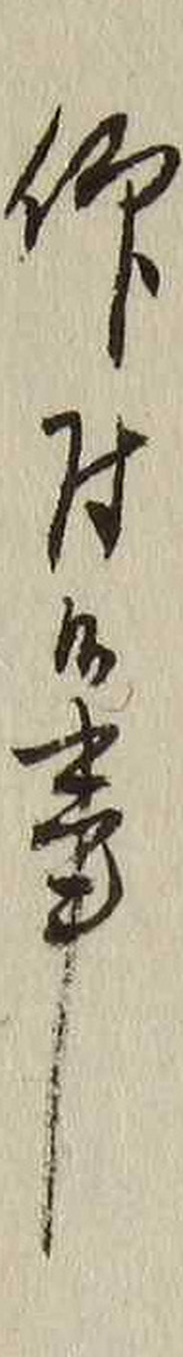仰付候事
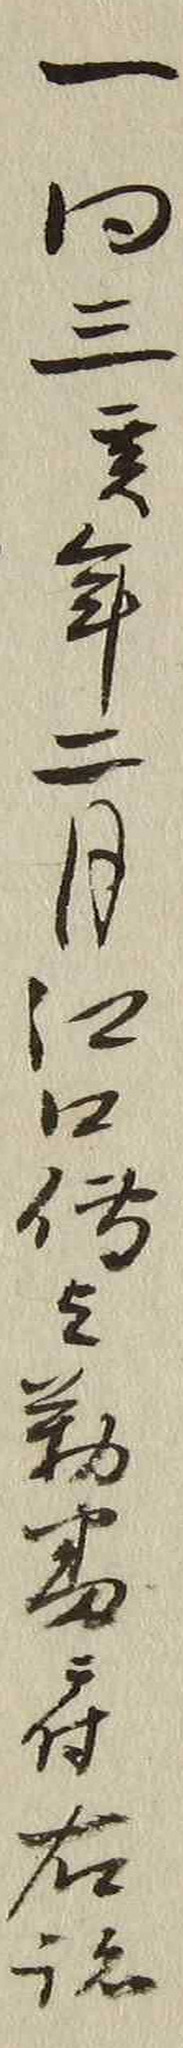一同三亥年二月江口伝与勤番ニ付右跡
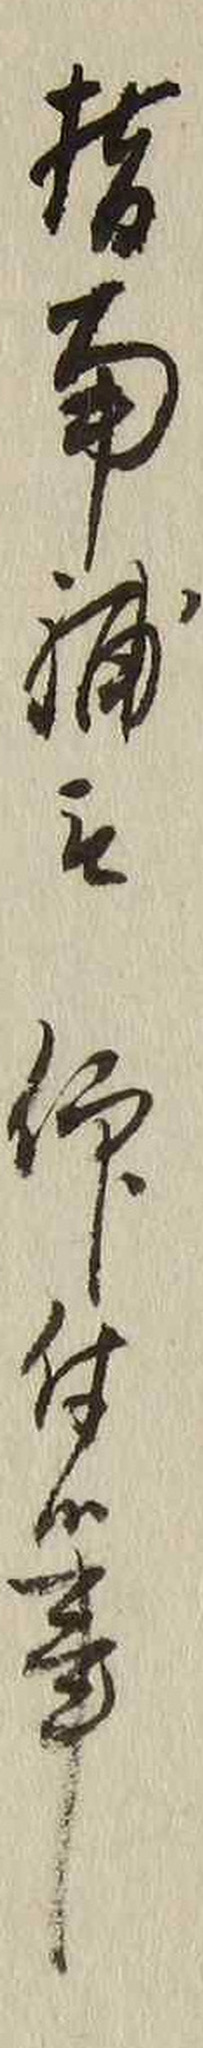指南補被仰付候事
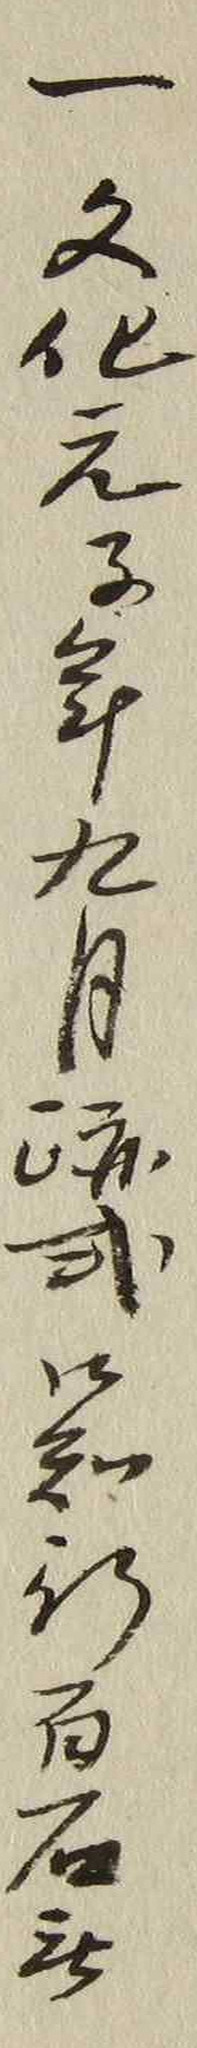一文化元子年九月跡式御知行百石無
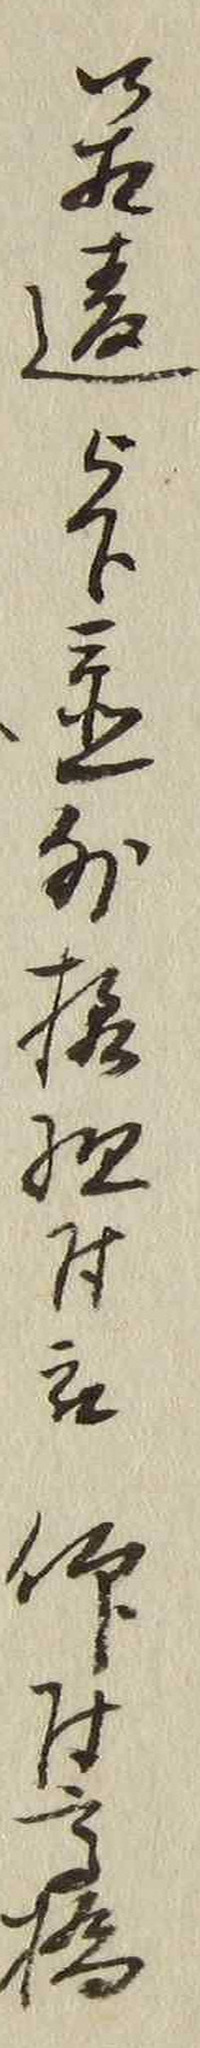御相違被下置外様組付被仰付高橋
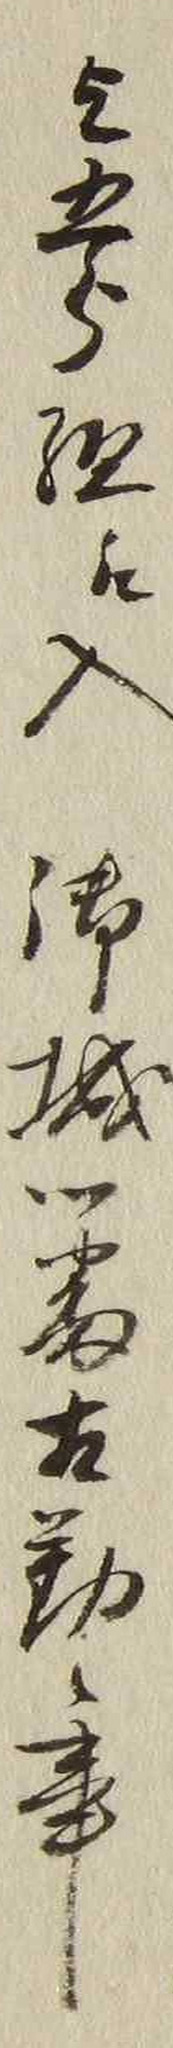与五郎組江入御城御番相勤候事
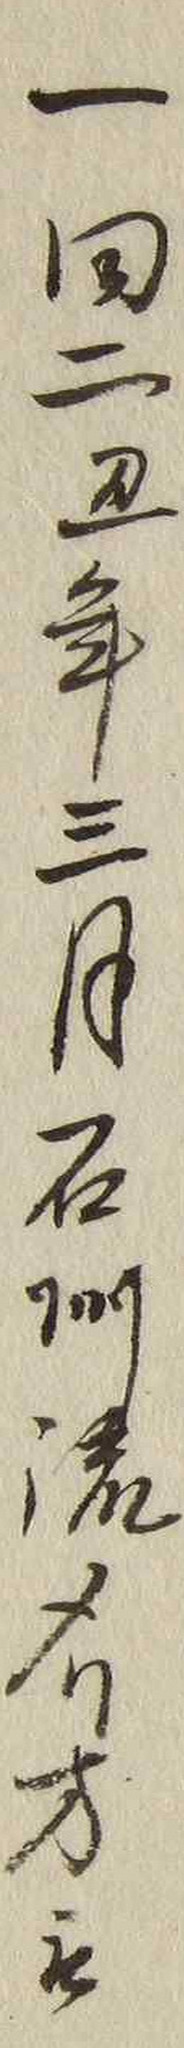一同二丑年三月石州流〆り方被
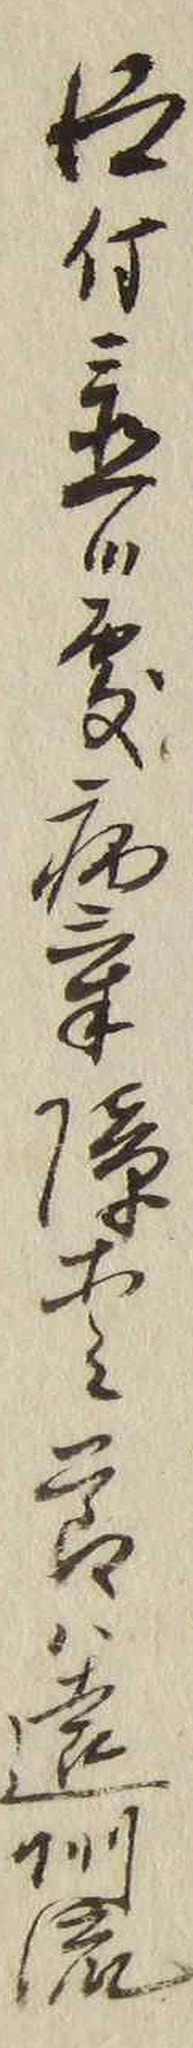仰付置候処病気障等之節ハ遠州流

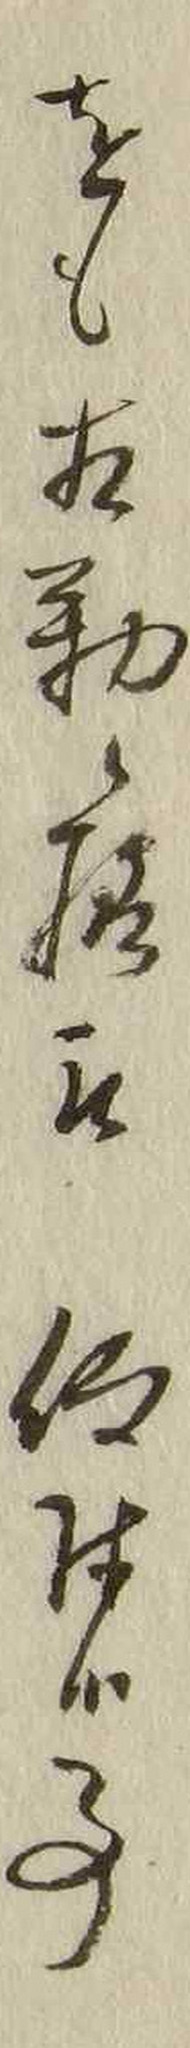をも相勤候様被仰付候事
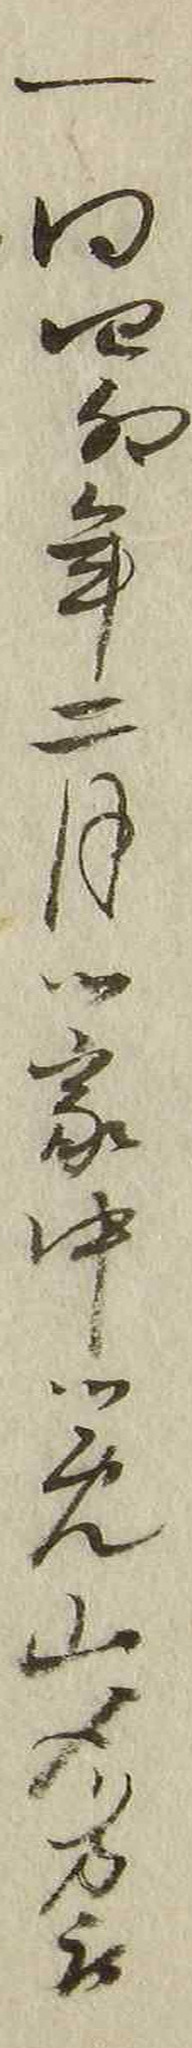一同四卯年二月御家中御免山〆り方被
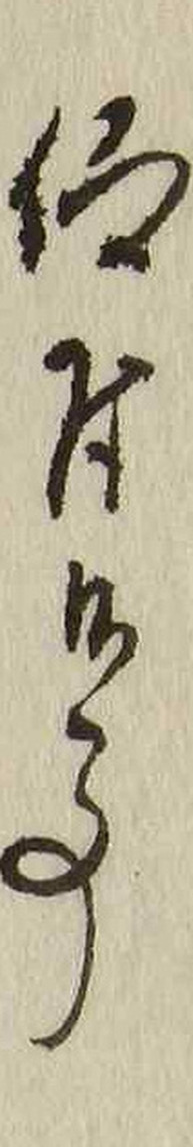仰付候事
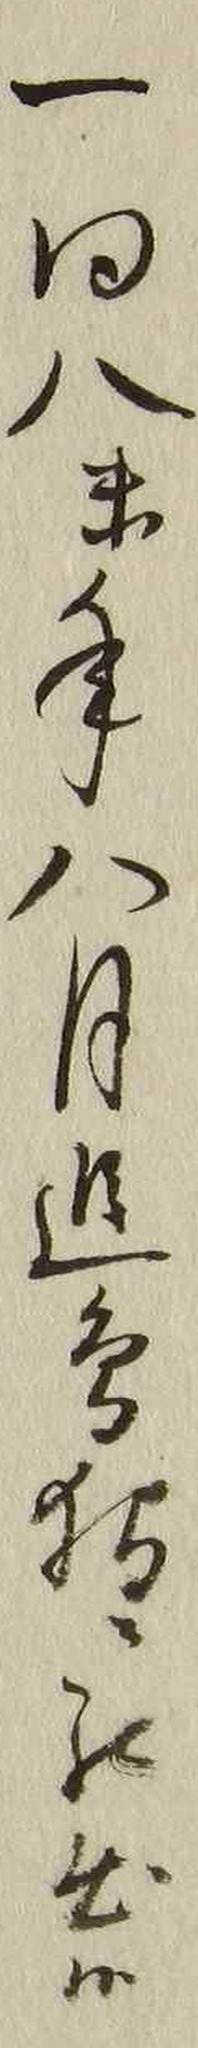一同八未年八月追鳥狩へ罷出候
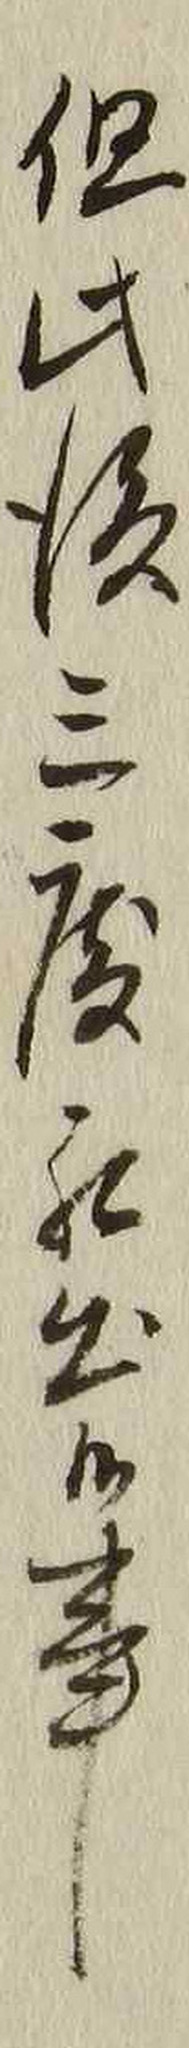但此後三度罷出候事
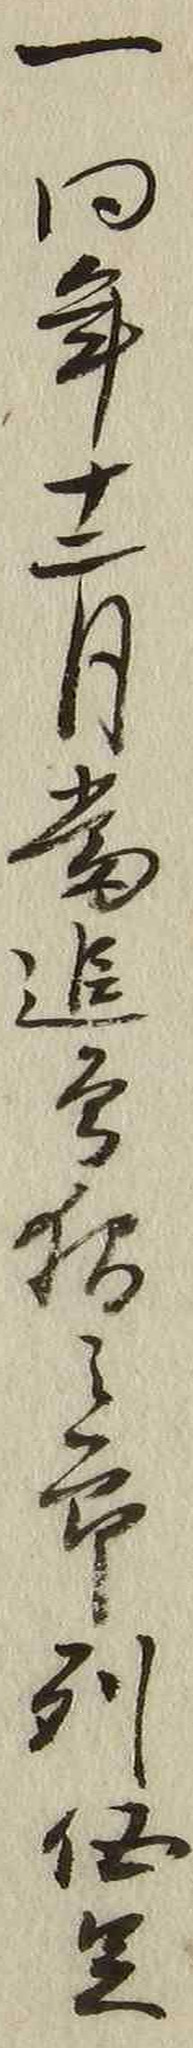一同年十二月当追鳥狩之節列伍足
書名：諸士系譜　巻之359　す之部9
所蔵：会津若松市立会津図書館
